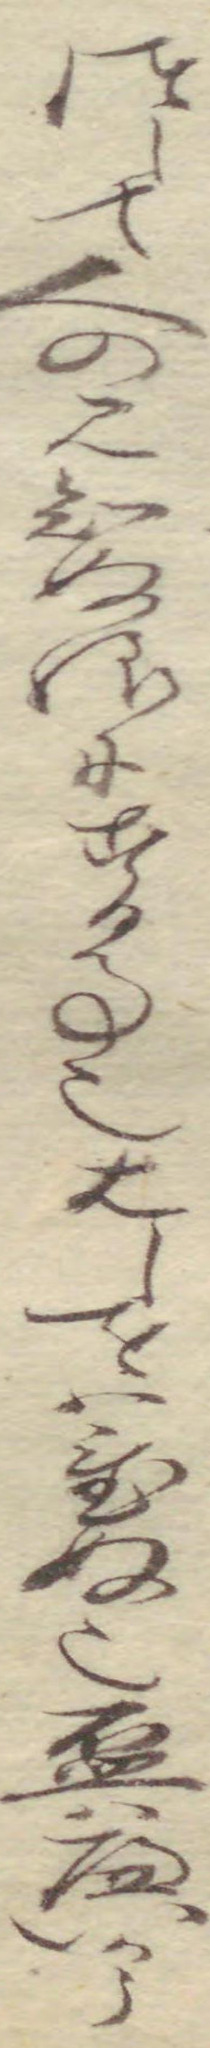つして人の見知ぬ様にする事也はしをハ置ぬ也盃はへいかう
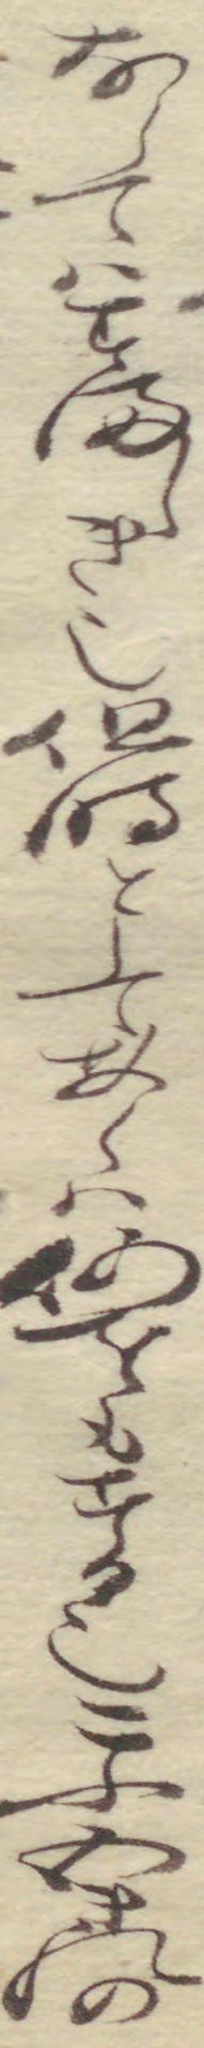ならてハすましき也但時としてなくハ何をもする也こふ五きれの
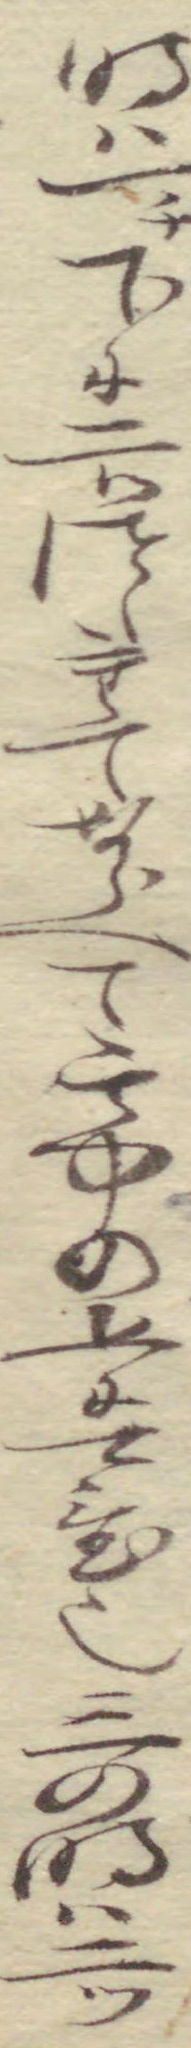時ハ一チ下にニツつゝ重てならへて其中の上に可置也三の時ハ二ツ
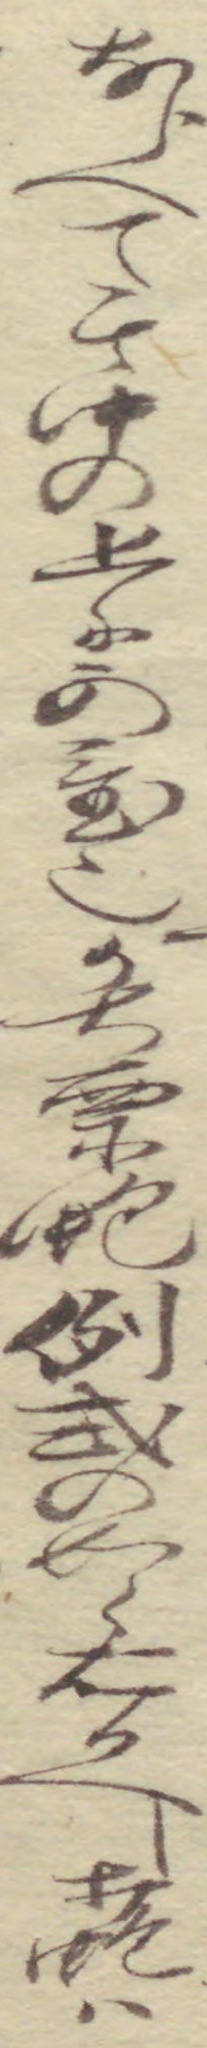ならへて其中の上に可置也かち栗蚫例式の如くたるへし打蚫ハ
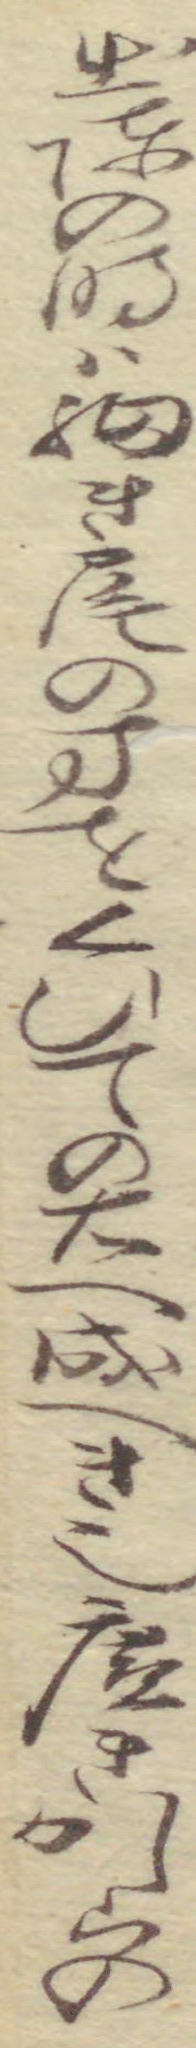出陣の時ハ細き尾の方をくいての右へ成へき也広きかしらの
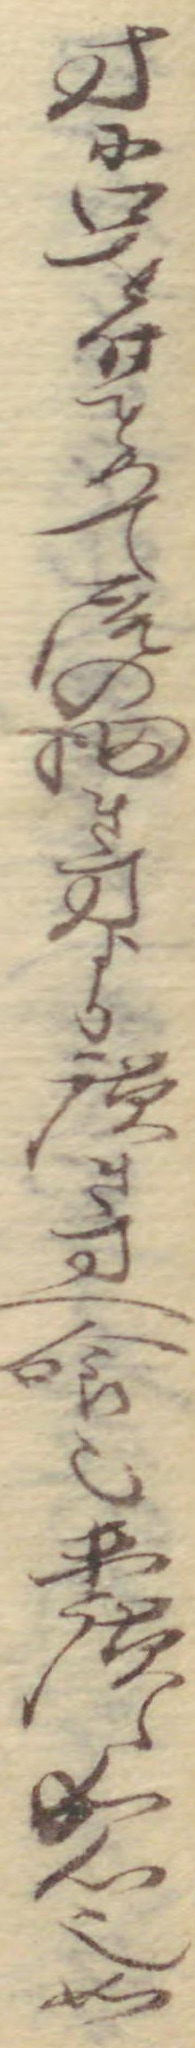方に口を付そめて尾の細き方より広き方へ喰ふ也末広く成心也如
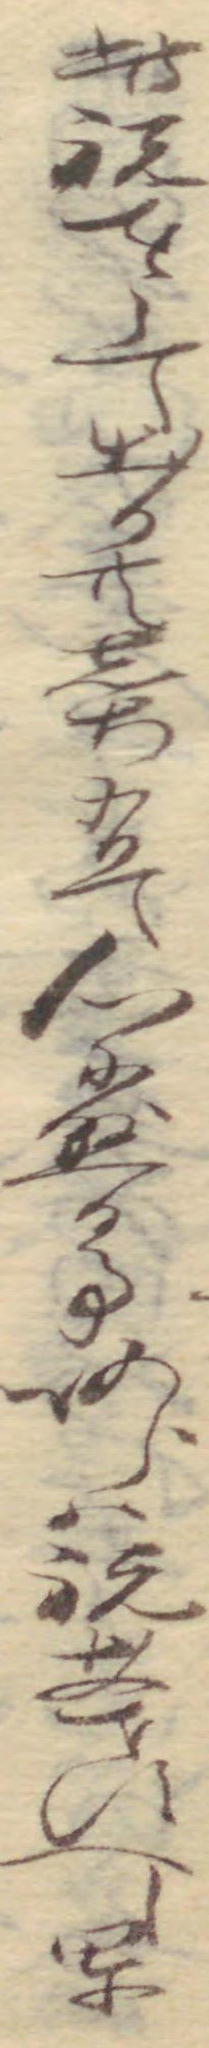此祝をして出る共しち有て心に懸る事あらハ祝なをすへし軍
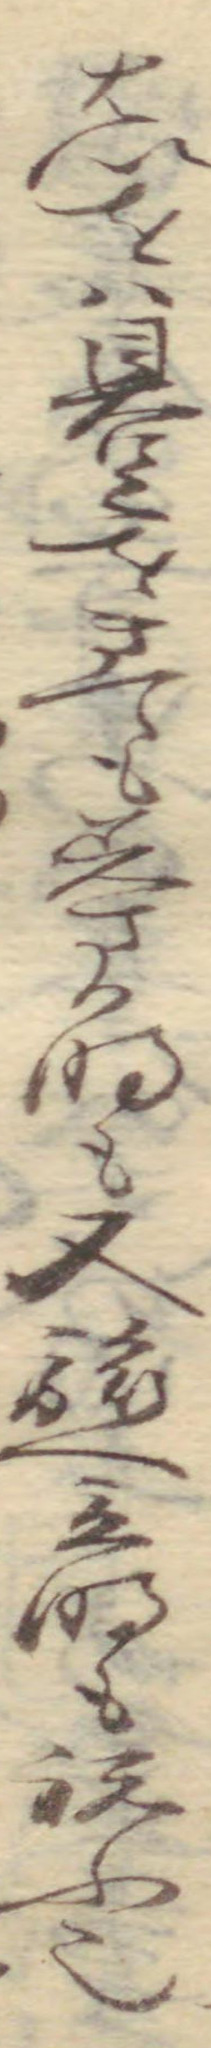はいをハ具足をきても着さる時も又旅へ立時も祝ふ也
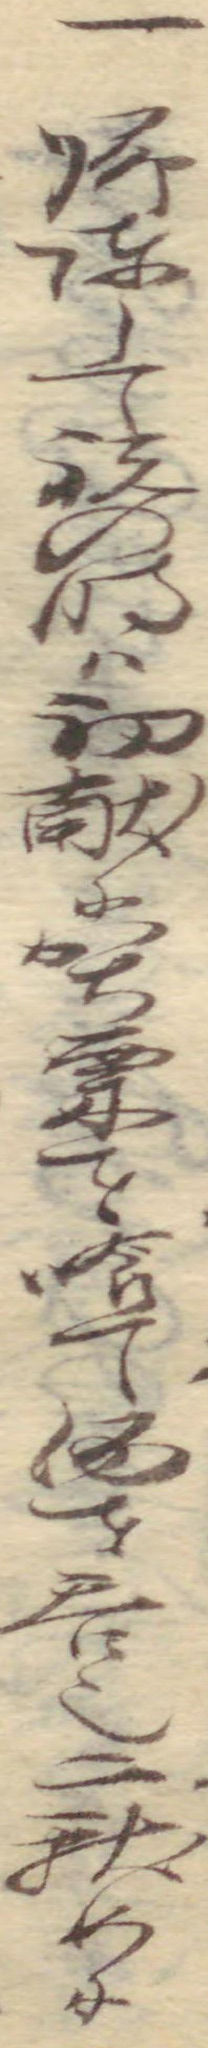一帰陣して祝の時ハ初献にかち栗を喰て酒を呑也ニ献めに
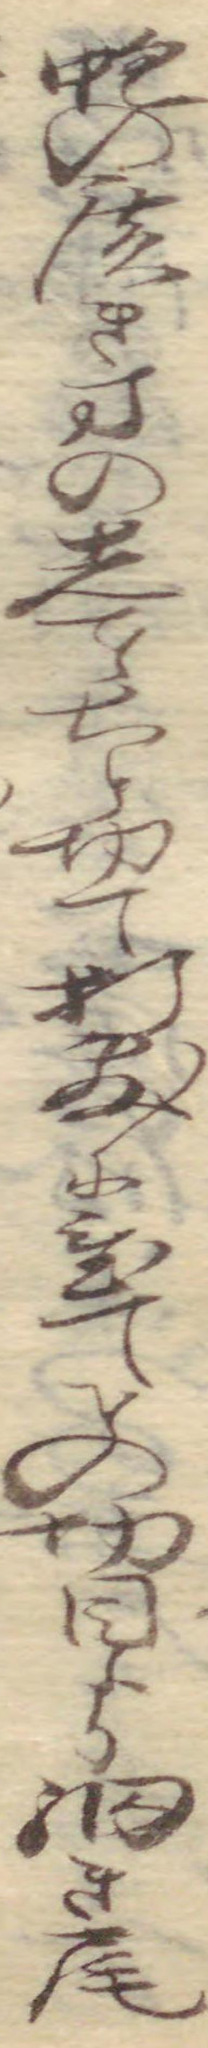蚫の広き方の先をちと切て折敷に置てその切目より細き尾
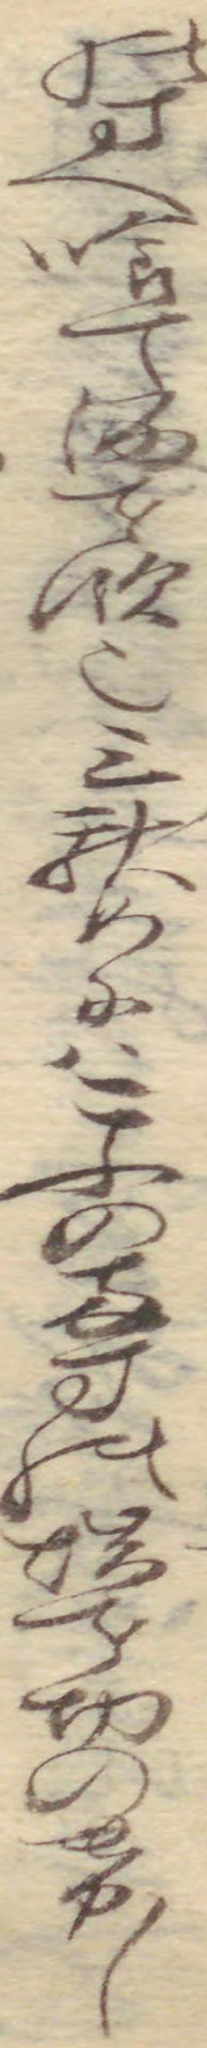の方をくひて酒を飲也三献めにハこふの両方の端を切のけ〳〵
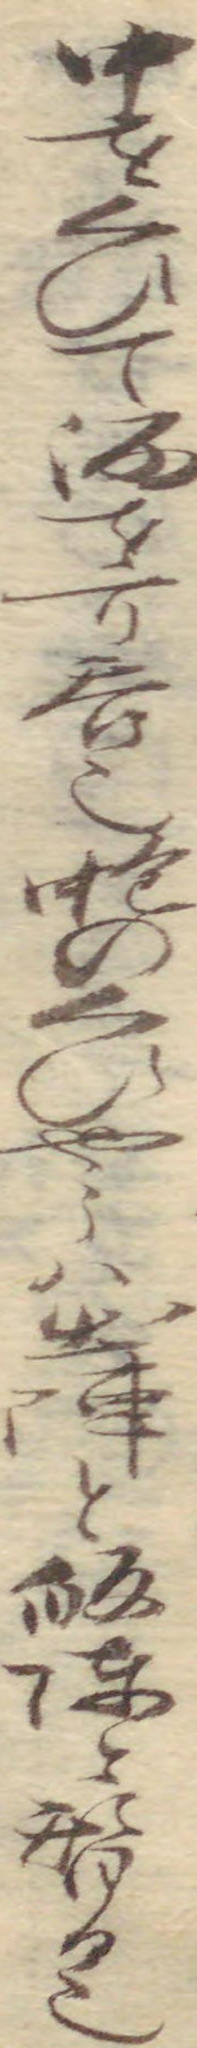中をくひて酒を可呑也蚫のくひやうハ出陣と帰陣と替也
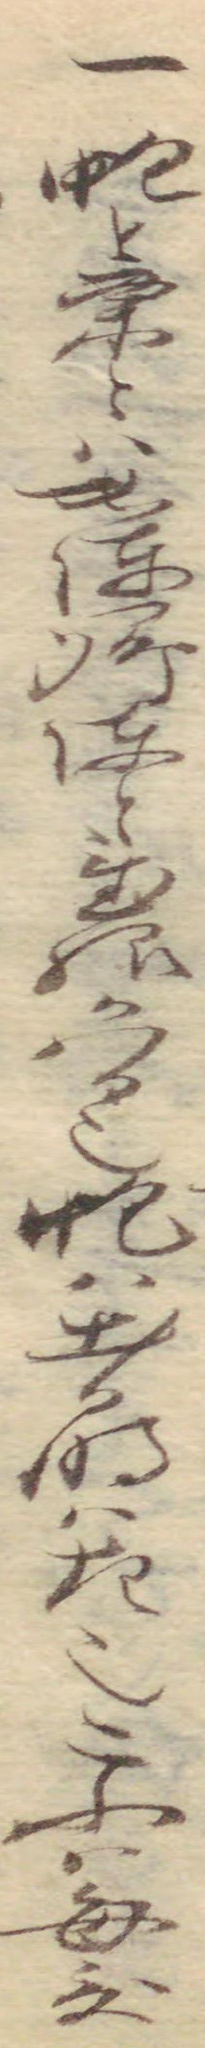一蚫と栗とハ出陣帰陣と置様かハる也蚫ハ出る時ハ左也こふハ毎度
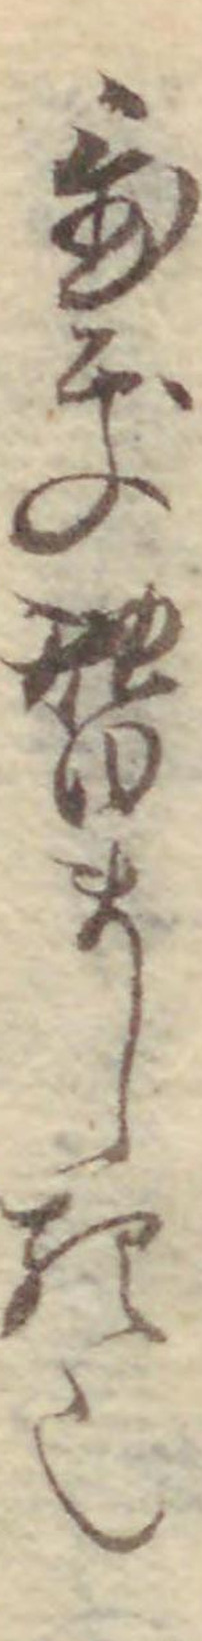置處替ましき也
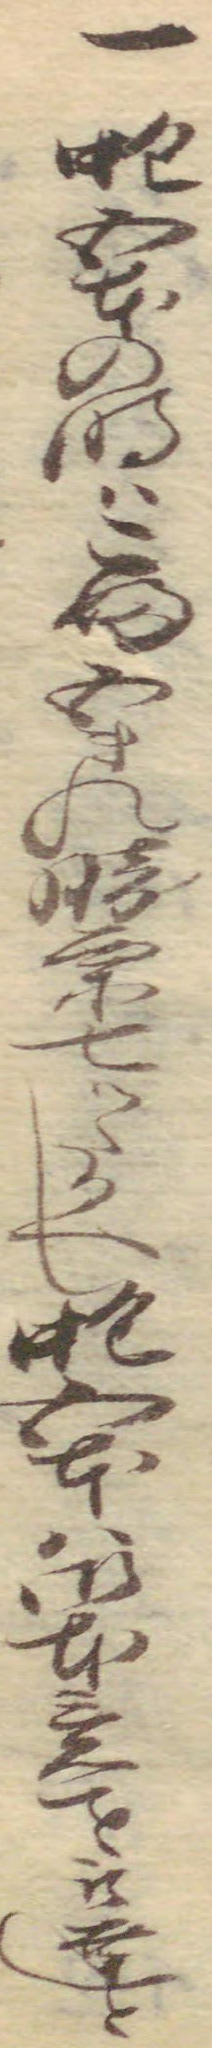一蚫五本の時ハこふ五きれ勝栗七ツたるへし蚫五本ハ御本意を被達と
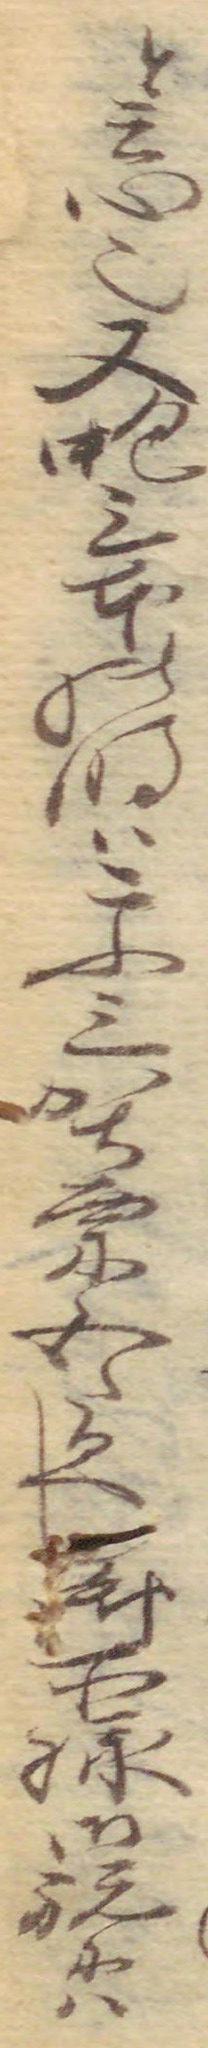と云心也又蚫三本の時ハこふ三かち栗五たるへし御所様御祝にハ
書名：鶯宿雑記. 巻199-200
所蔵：国立国会図書館 National Diet Library, JAPAN
